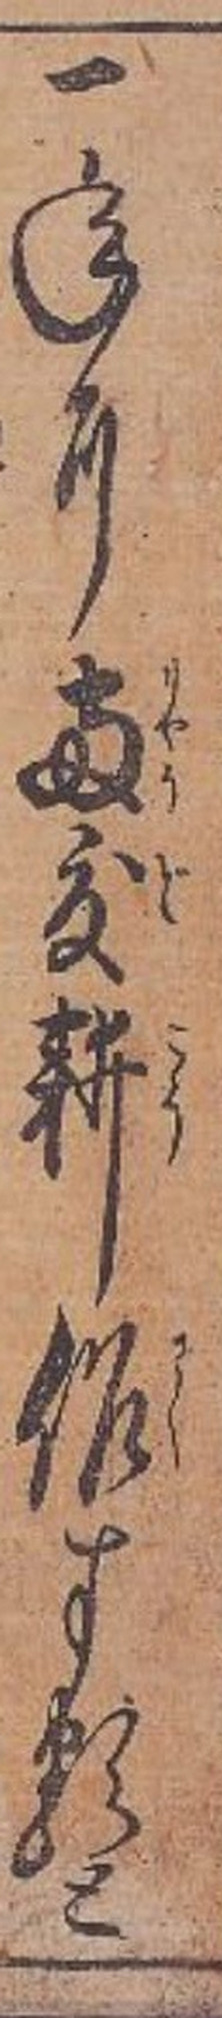一年可両度耕作すると
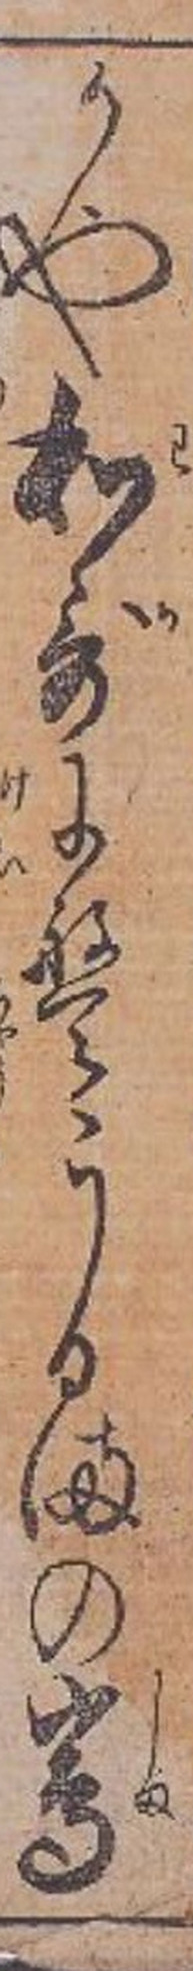かや和哥にはうるまの嶋
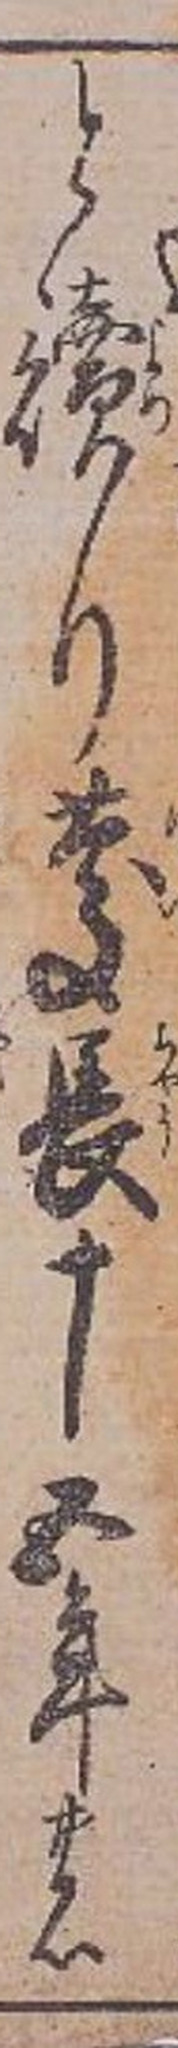と讀り慶長十五年の
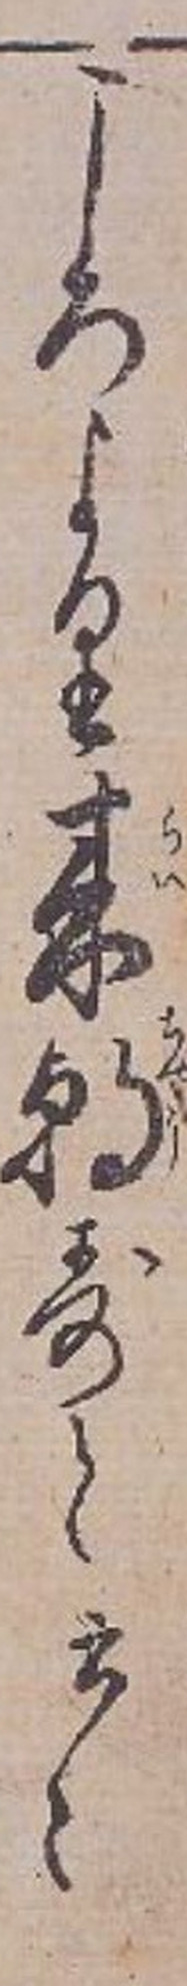ころより来朝すと云々
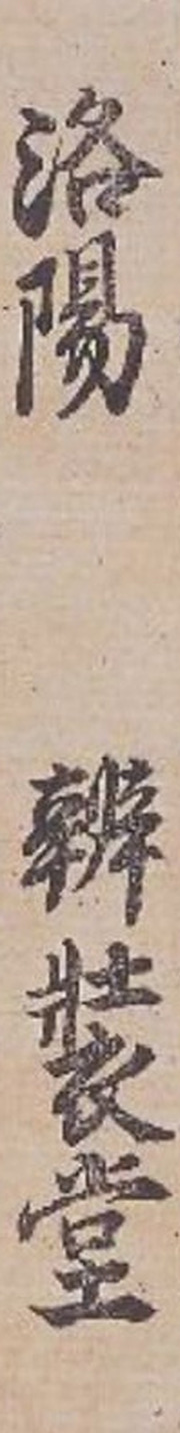洛陽辯装堂
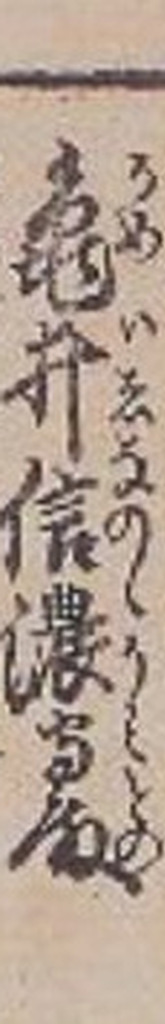亀井信濃守殿
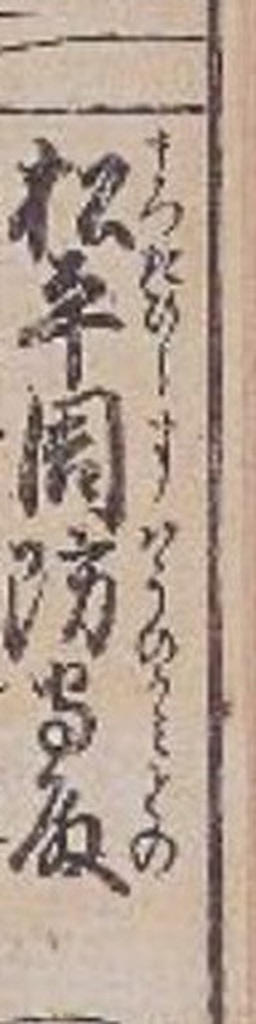松平周防守殿
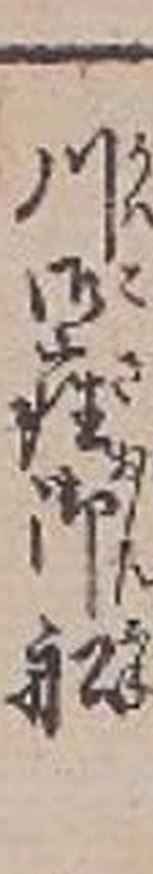川御座御船
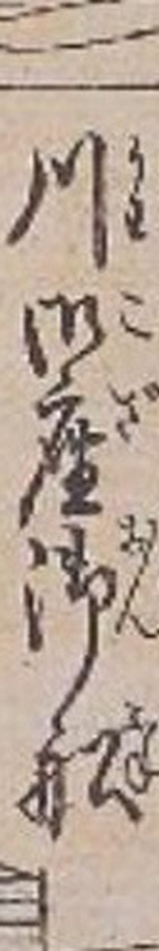川御座御船

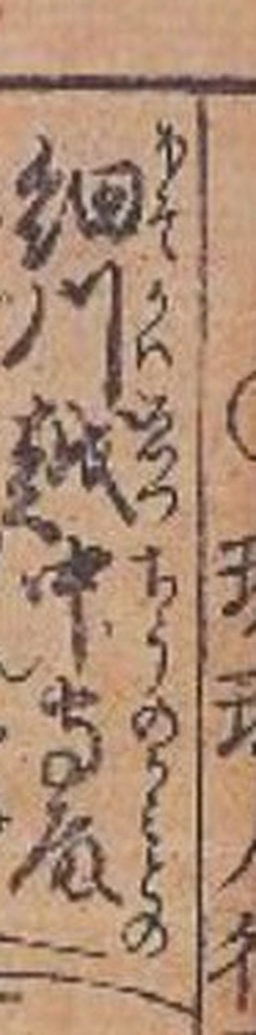細川越中守殿
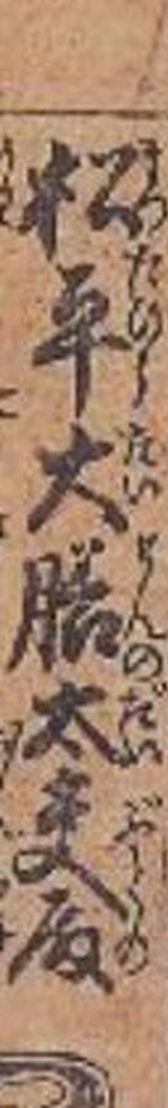松平大膳太夫殿
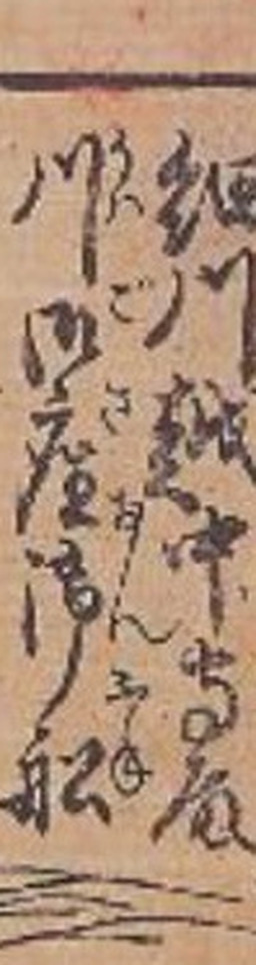川御座御船
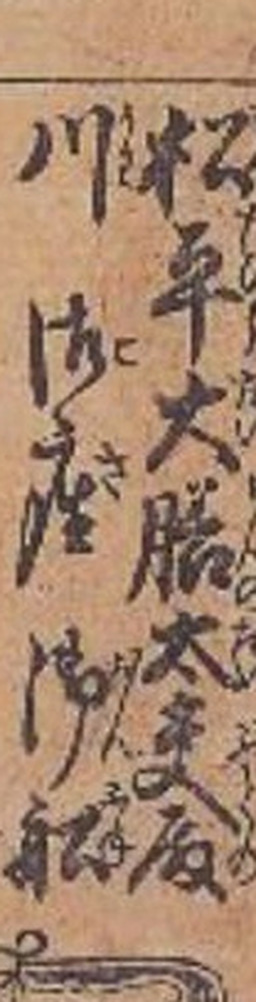川御座御船
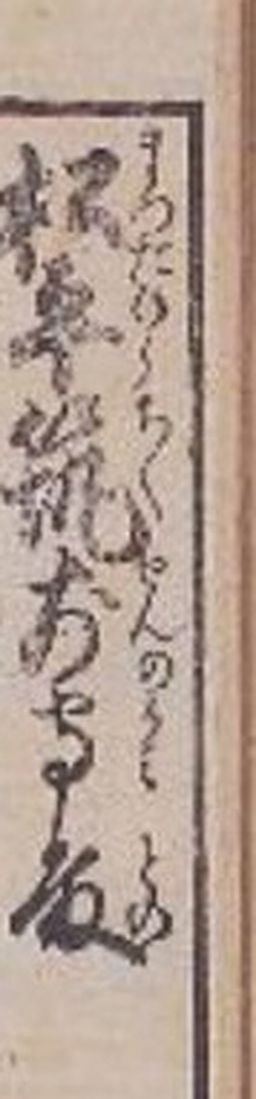松平筑前守殿
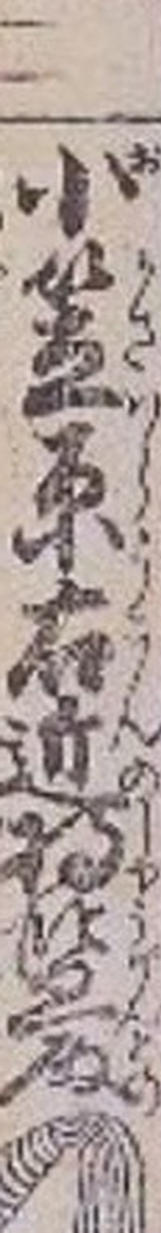小笠原右近将監殿
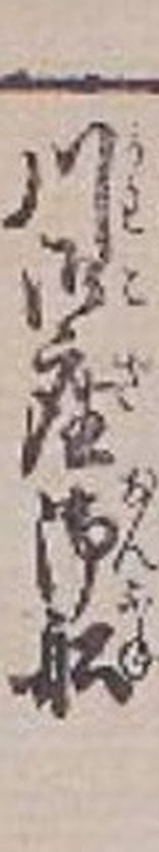川御座御船
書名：琉球人大行列記 大全 来朝新板絵入
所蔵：University of the Ryukyus Library
